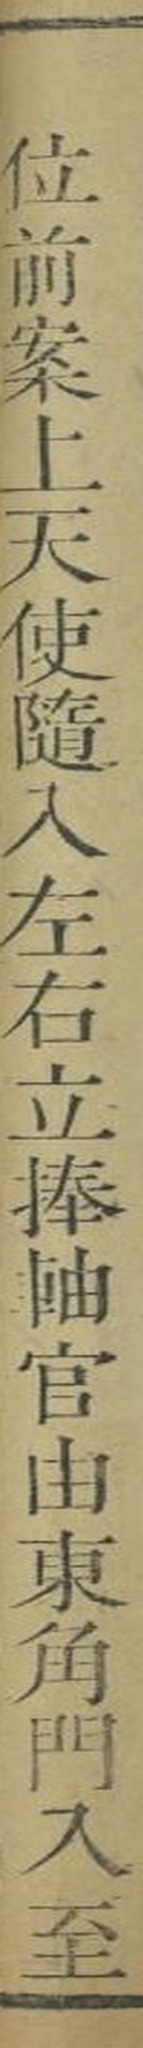位前案上天使隨入左右立捧軸官由東角門入至
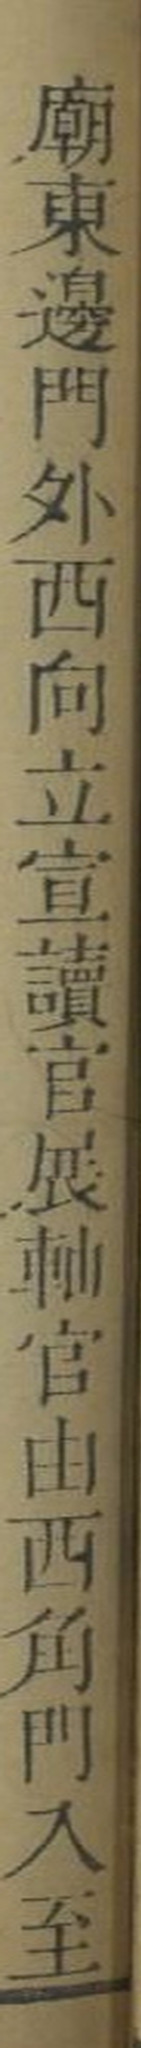廟東邊門外西向立宣讀官展軸官由西角門入至
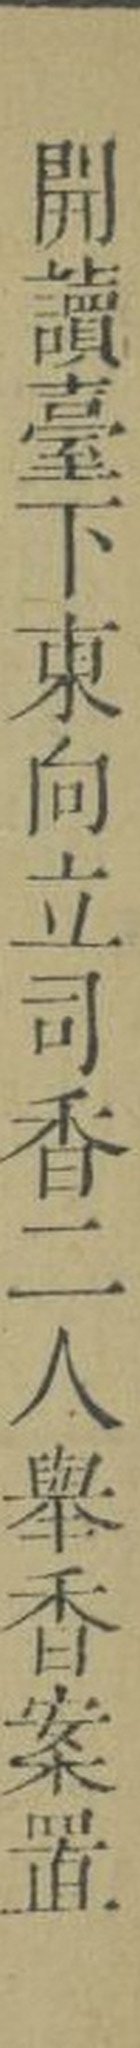開讀臺下東向立司香二人舉香案置
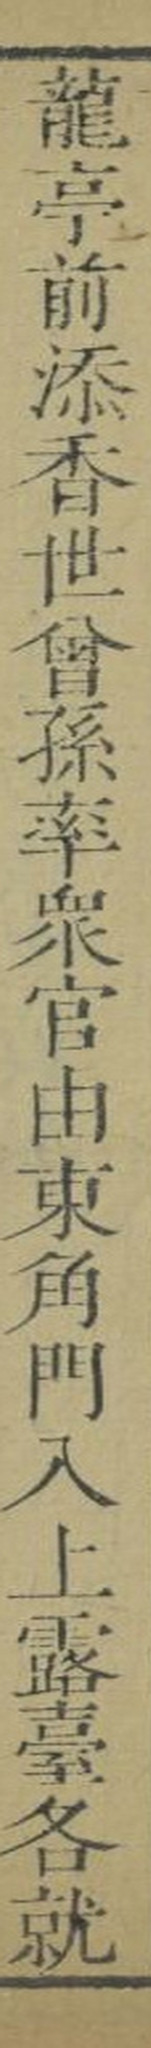龍亭前添香世曾孫率衆官由東角門入上露臺各就
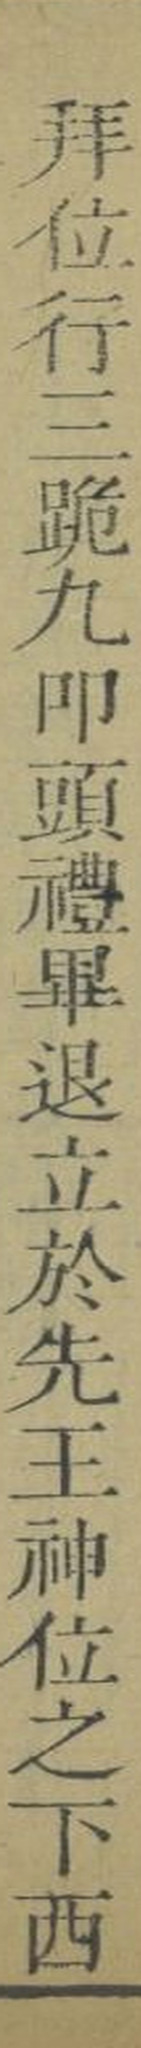拜位行三跪九叩頭禮畢退立於先王神位之下西
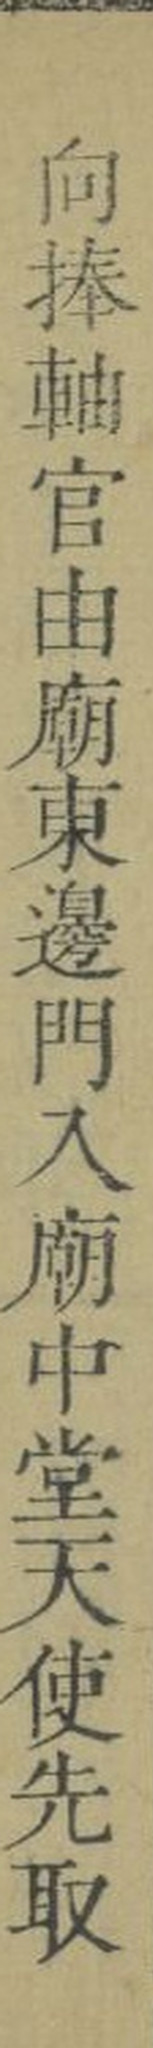向捧軸官由廟東邊門入廟中堂天使先取
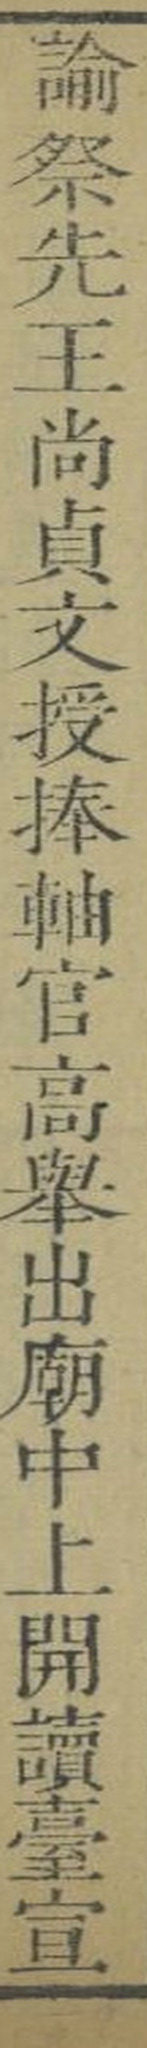諭祭先王尚貞文授捧軸官高舉出廟中上開讀臺宣
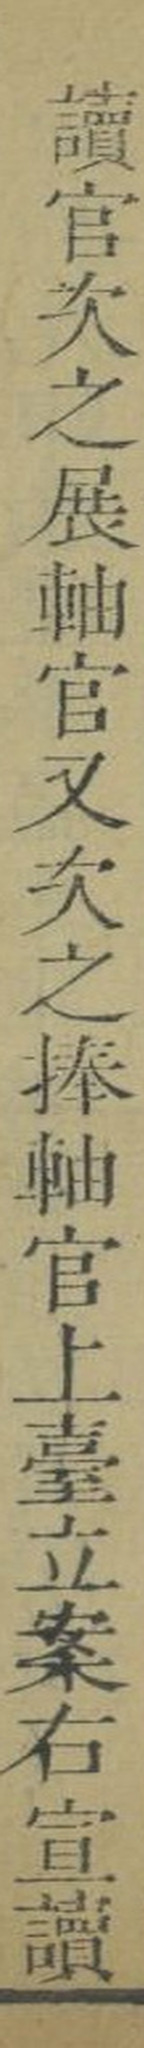讀官次之展軸官又次之捧軸官上臺立案右宣讀
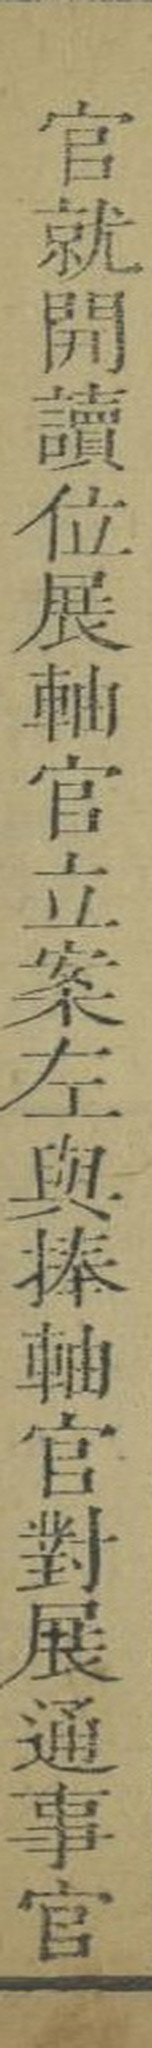官就開讀位展軸官立案左與捧軸官對展通事官
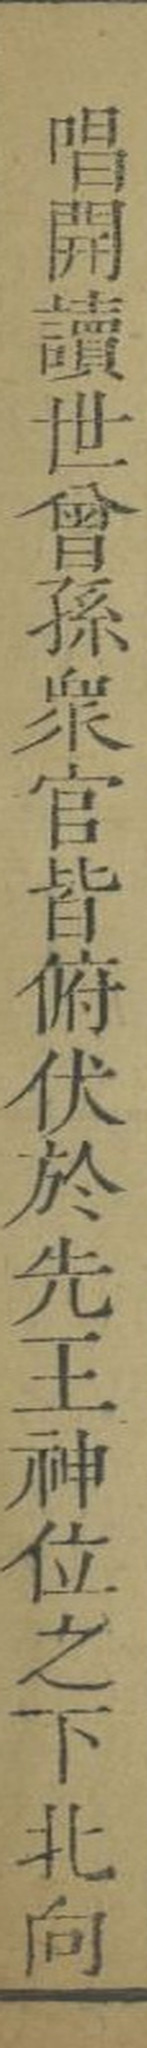唱開讀世曾孫衆官皆俯伏於先王神位之下北向

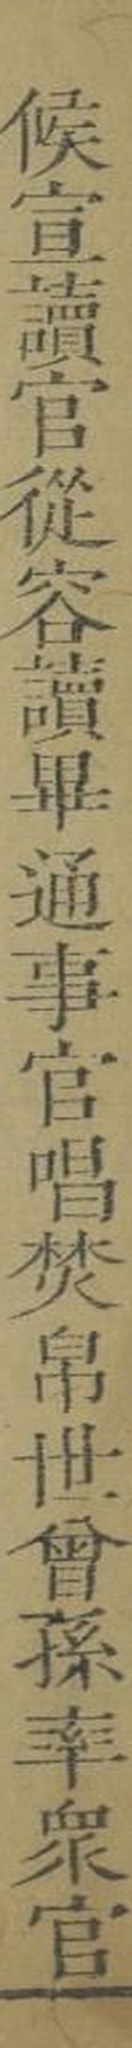候宣讀官從容讀畢通事官唱焚帛世曾孫率衆官
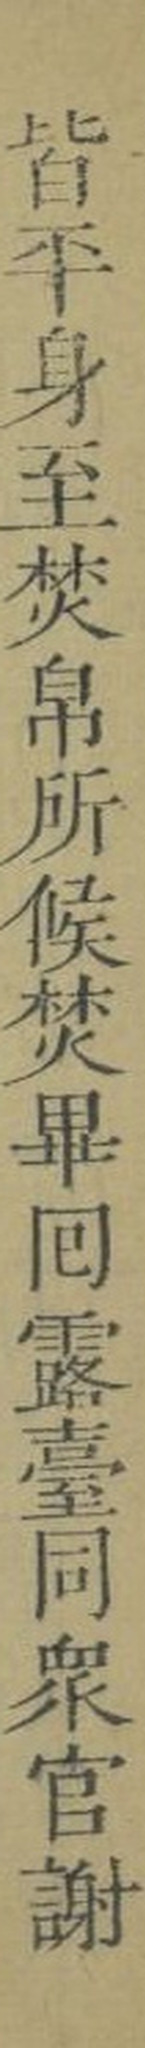皆平身至焚帛所候焚畢囘露臺同衆官謝
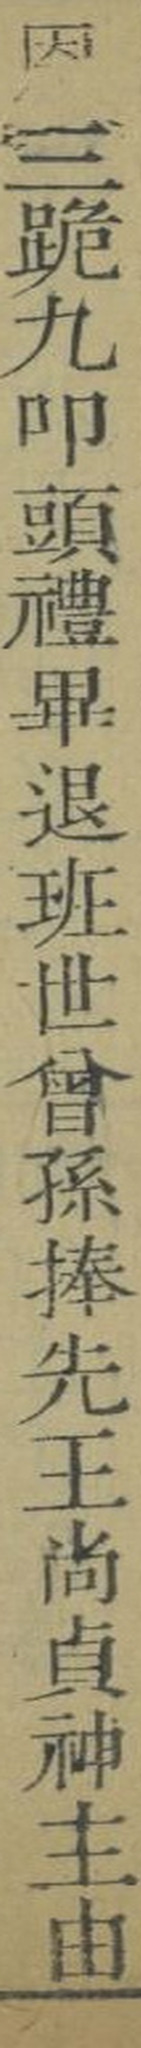恩三跪九叩頭禮畢退班世曾孫捧先王尚貞神主由
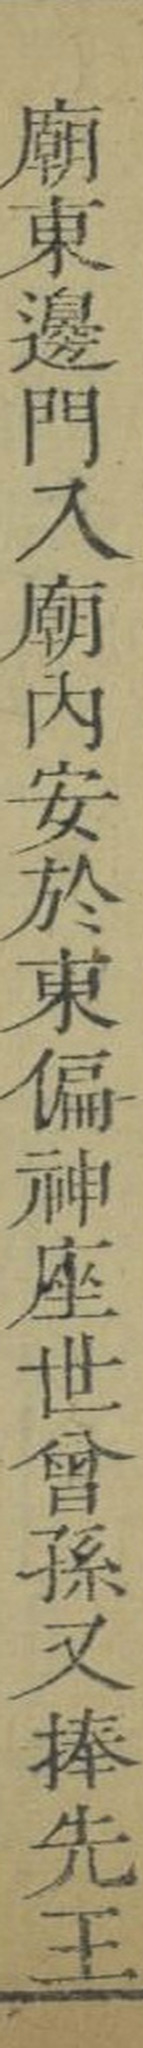廟東邊門入廟内安於東偏神座世曾孫又捧先王
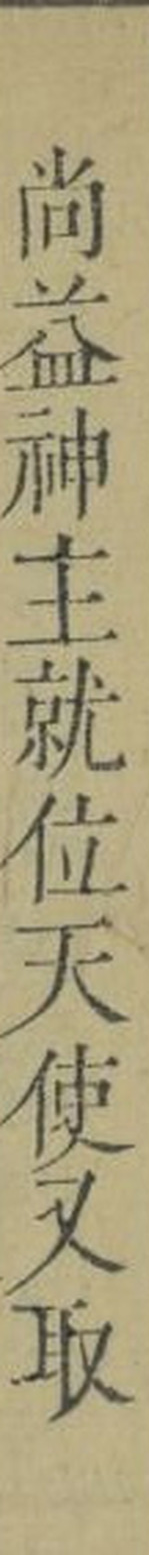尚益神主就位天使又取
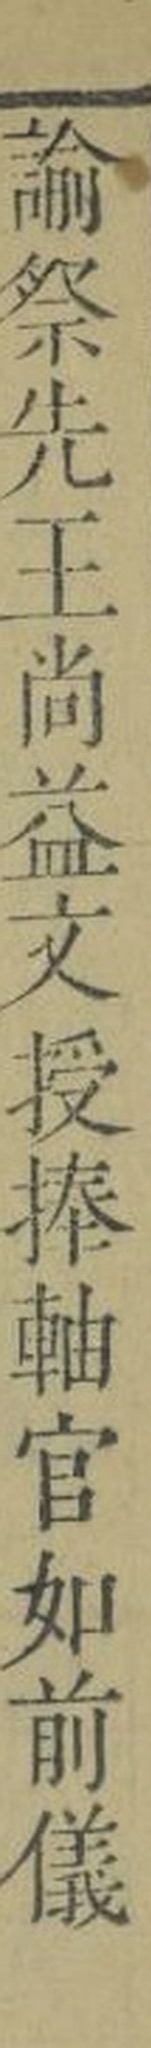諭祭先王尚益文授捧軸官如前儀
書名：中山伝信録 巻二
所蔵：University of the Ryukyus Library
